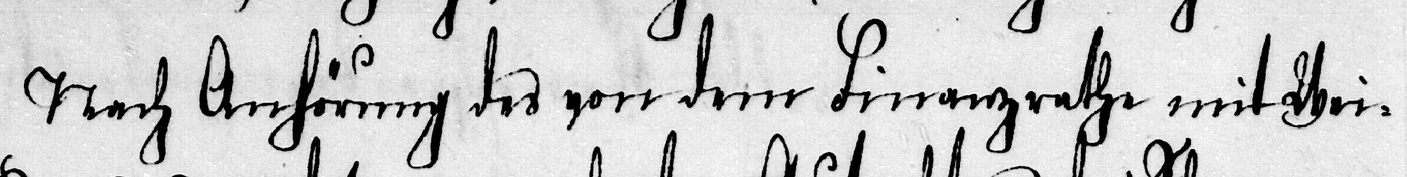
Nach Anhörung des von dem Finanzrathe mit Wei¬
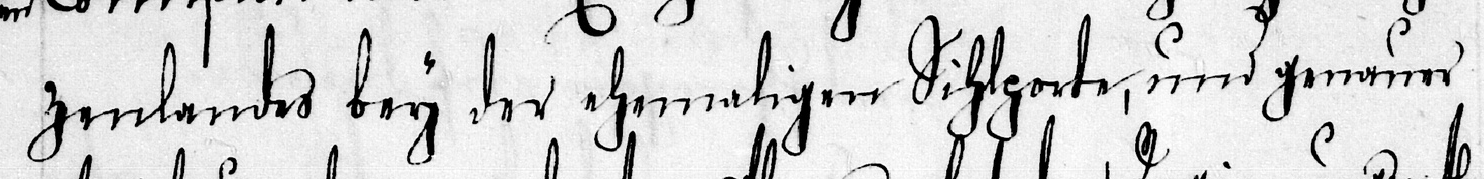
zenlandes bey der ehemaligen Sihlporte, und genauer
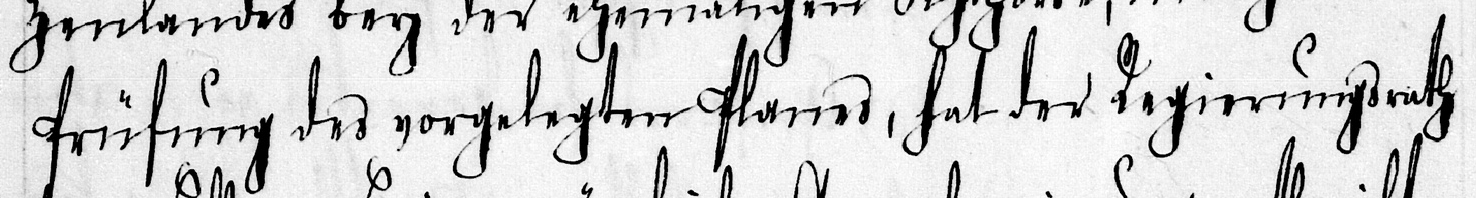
Prüfung des vorgelegten Planes, hat der Regierungsrath
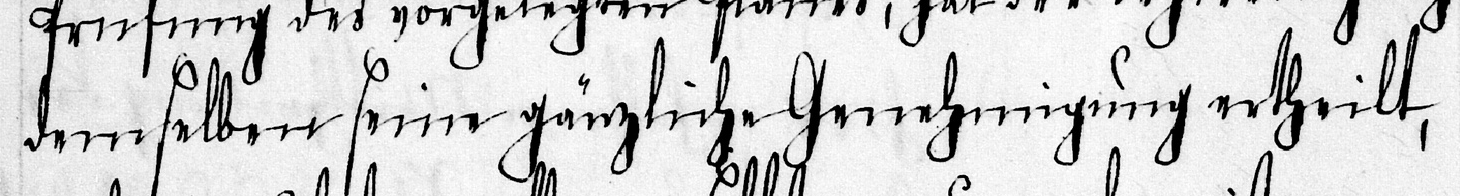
demselben seine gänzliche Genehmigung ertheilt,
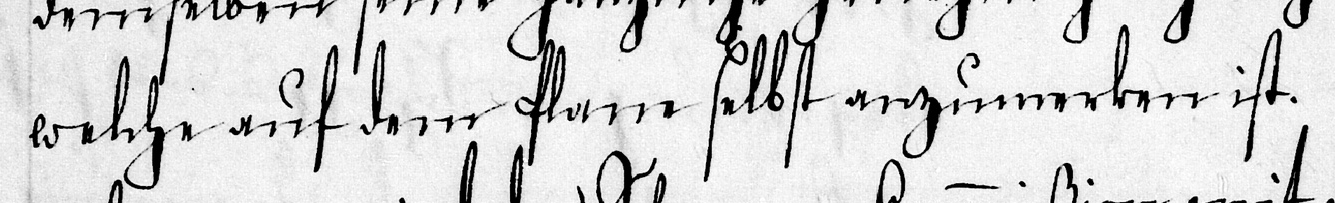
welche auf dem Plane selbst anzumerken ist.
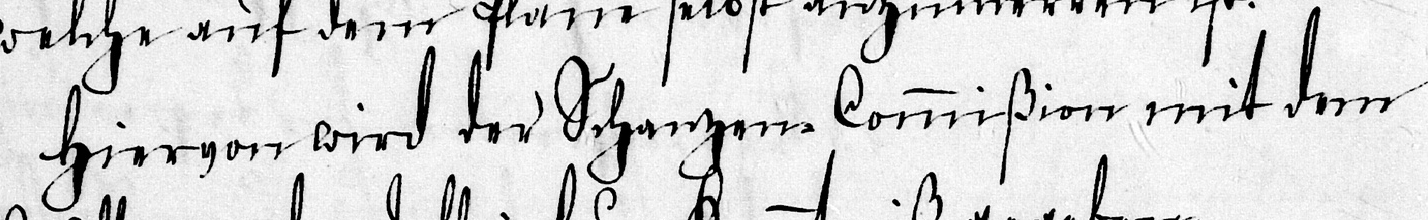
Hiervon wird der Schanzen-Commißion mit dem
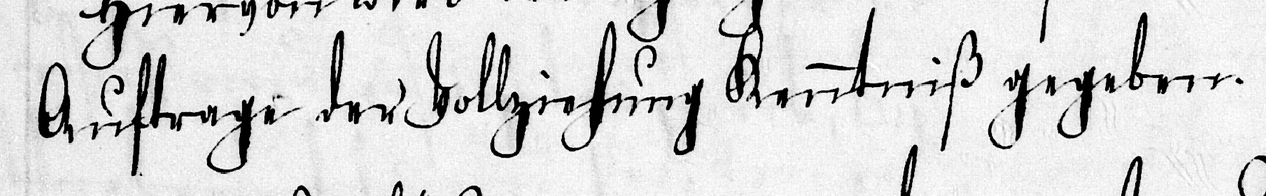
Auftrage der Vollziehung Kenntniß gegeben.
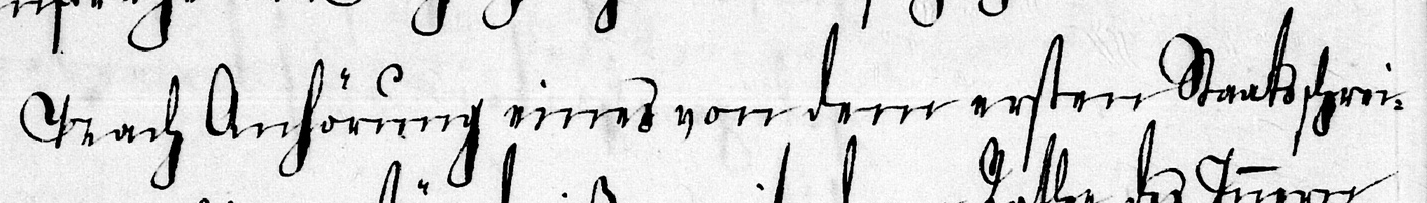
Nach Anhörung eines von dem ersten Staatsschrei¬
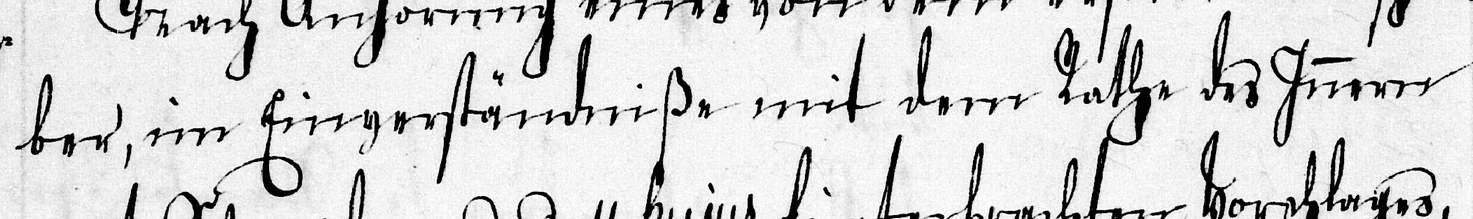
ber, im Einverständniße mit dem Rathe des Innern
